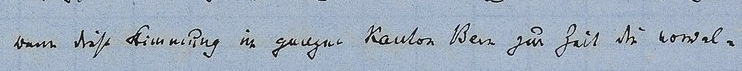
wenn diese Stimmung im ganzen Kanton Bern zur Zeit die vorwal-
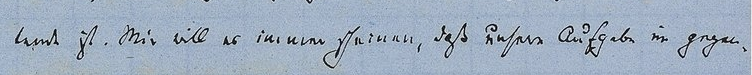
tende ist. Mir will es immer scheinen, daß unsere Aufgabe im gegen-
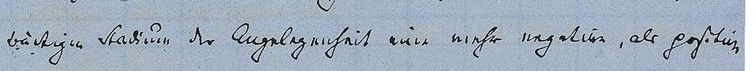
wärtigen Stadium der Angelegenheit eine mehr negative, als positive
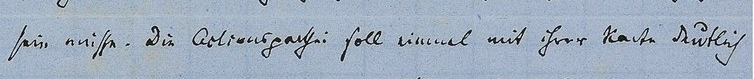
sein müsse. Die Actionsparthei soll einmal mit ihrer Karte deutlich
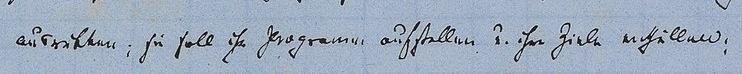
ausrükken; sie soll ihr Programm aufstellen u. ihre Ziele enthüllen:
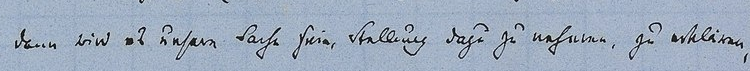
dann wird es unsere Sache sein, Stellung dazu zu nehmen, zu erklären,
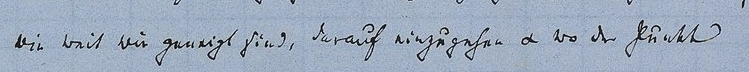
wie weit wir geneigt sind, darauf einzugehen & wo der Punkt
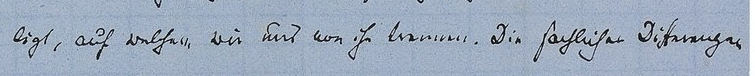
ligt, auf welchem wir uns von ihr trennen. Die sachlichen Differenzen
